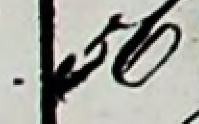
56
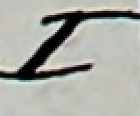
I
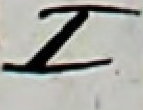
I
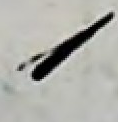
1
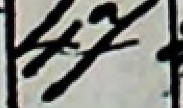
47
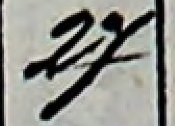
27
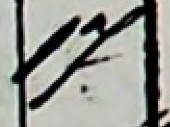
17
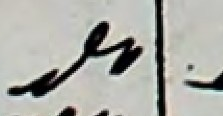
do
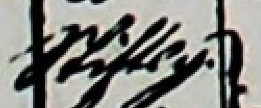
Stiftsg.
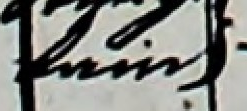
Rain
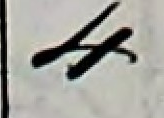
4
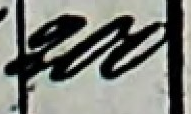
200
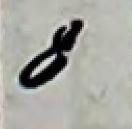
8
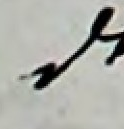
do
